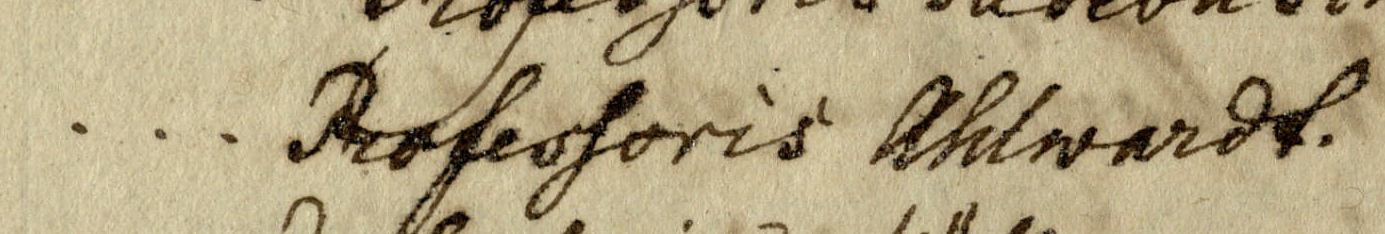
Professoris Ahlwardt.
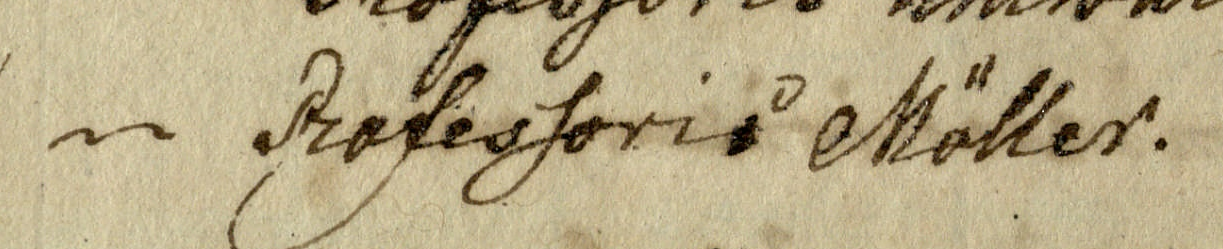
Professoris Möller.
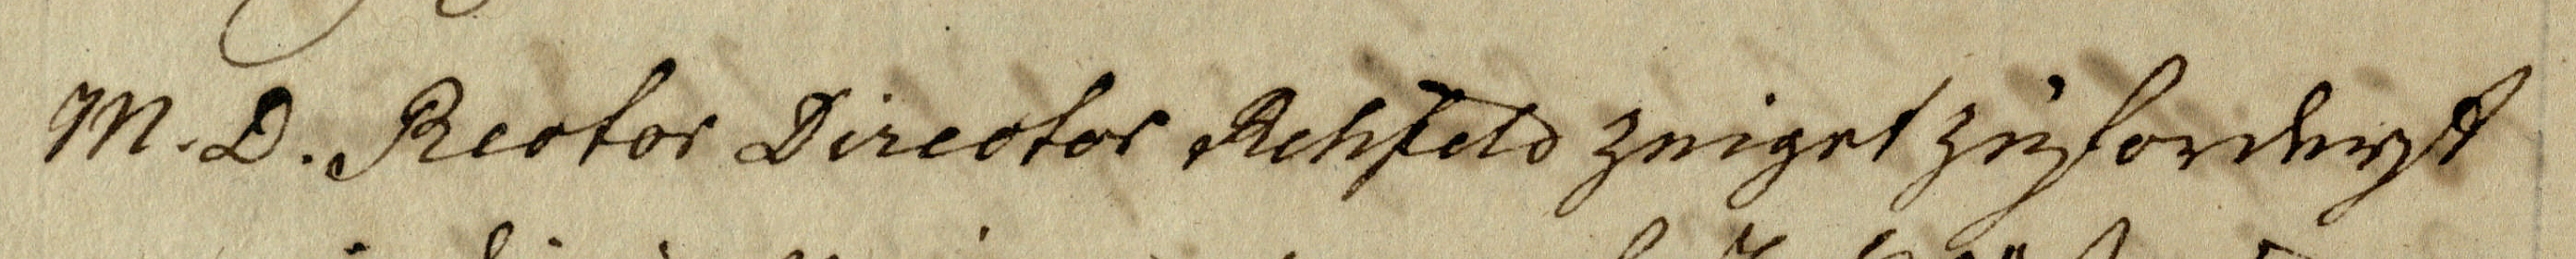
M. D. Rector Director Rehfeld zeiget zuförderst
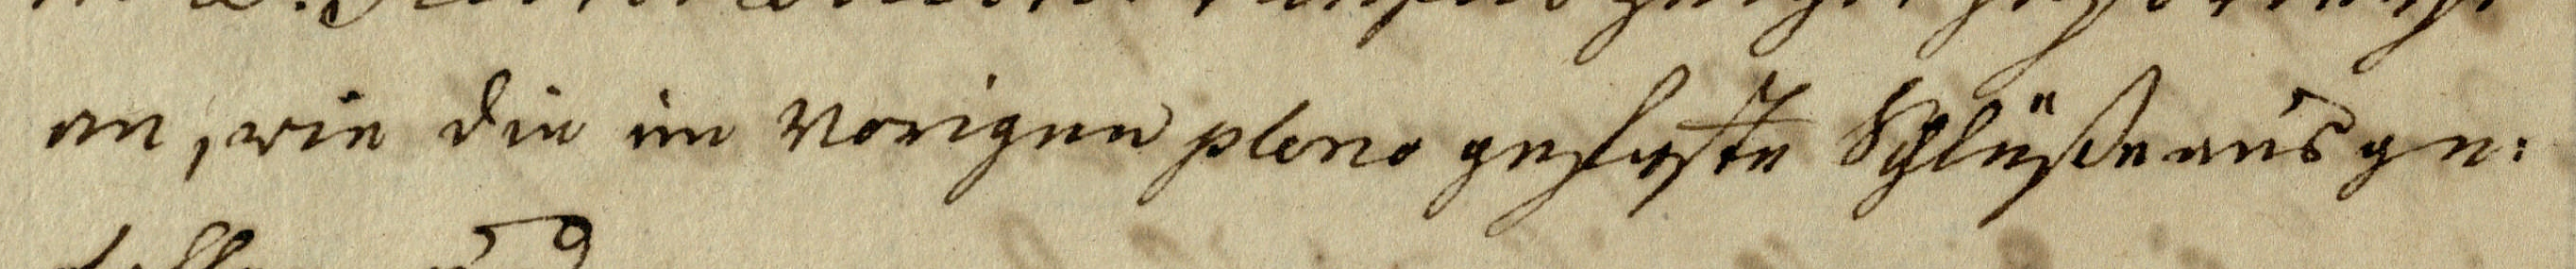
an, wie die im vorigen pleno gefaßte Schlüße ausge¬
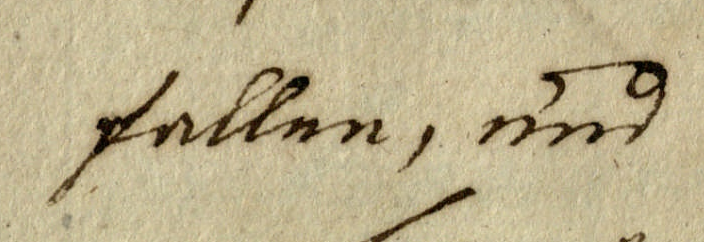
fallen, und
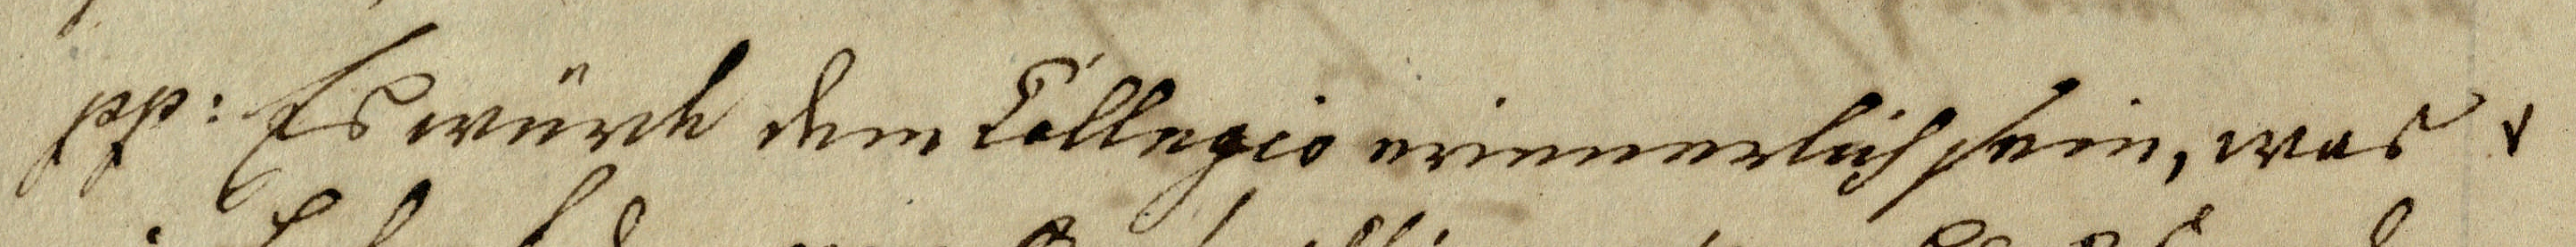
pp. Es würde dem Collegio erinnerlich sein, was
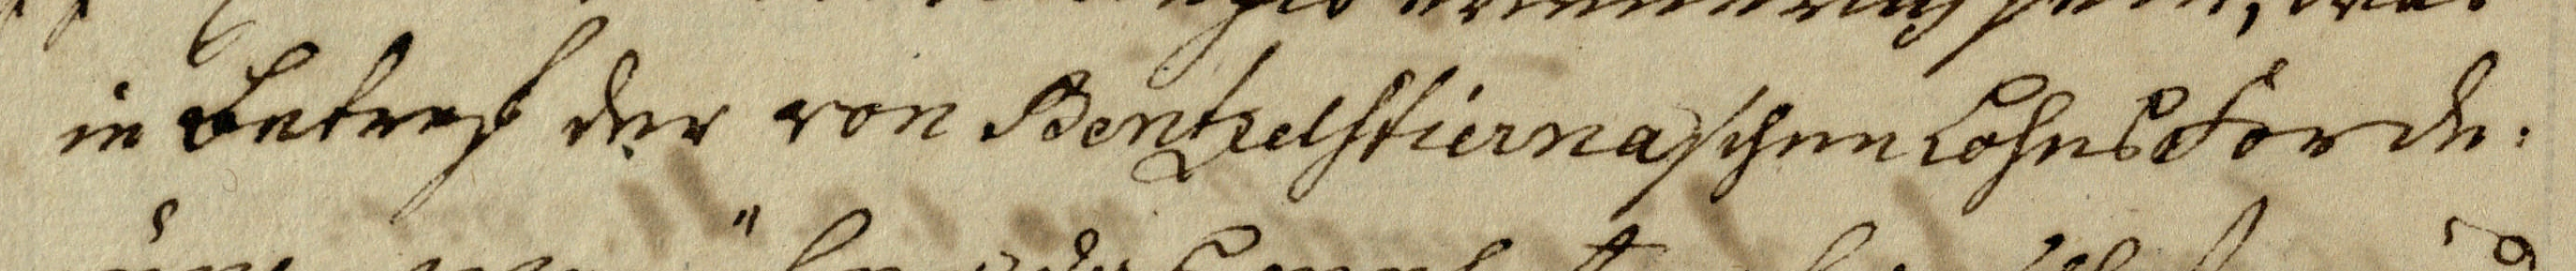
in Betref der von Bentzelstiernaschen LohnsForde¬
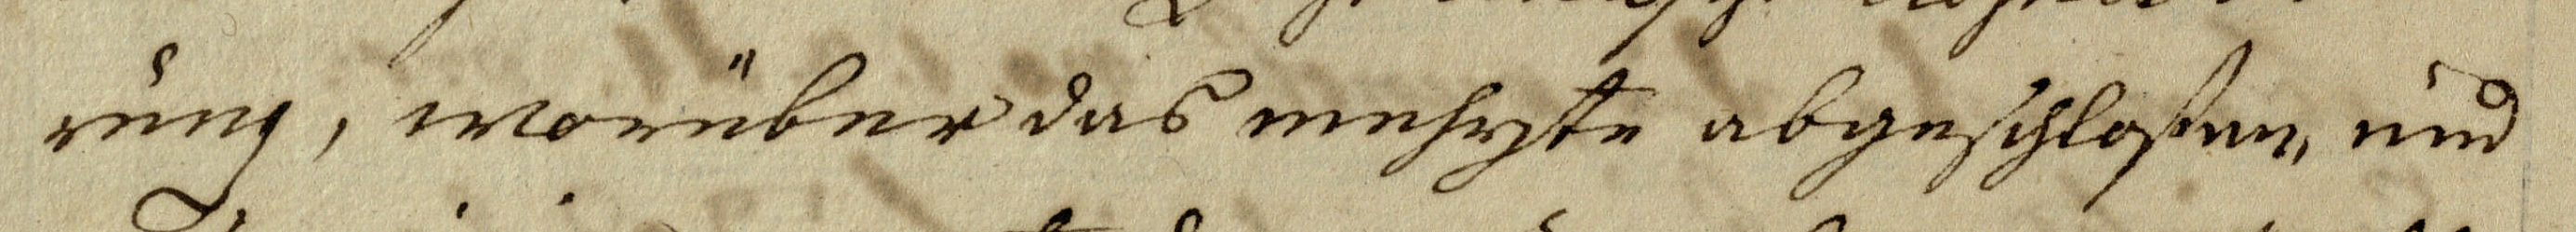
rung, worüber das mehrste abgeschloßen, und
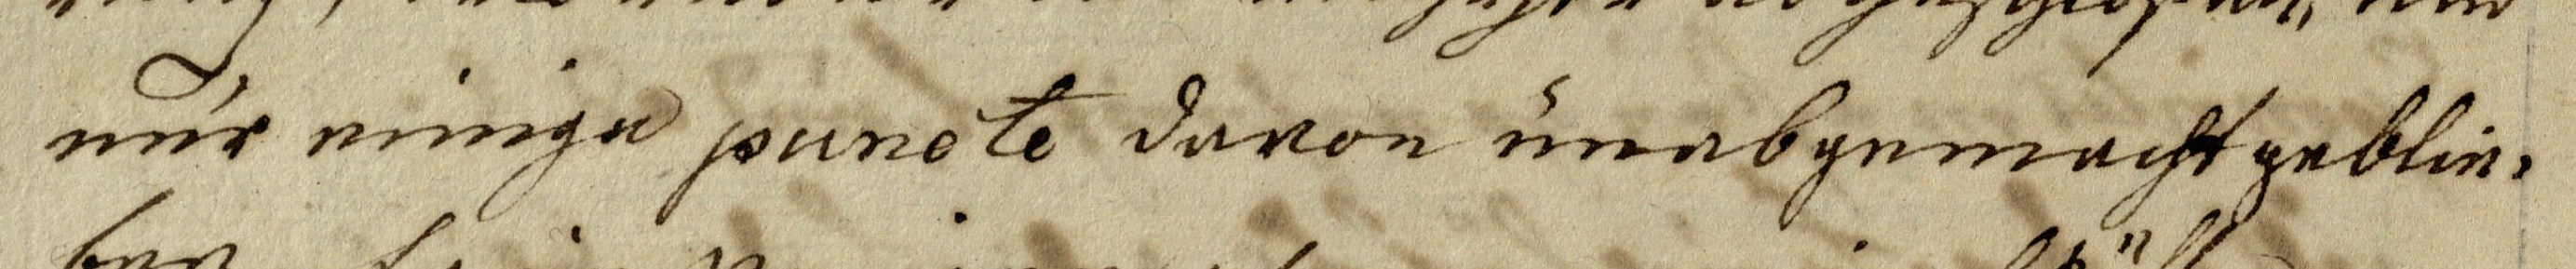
nur einige puncte davon unabgemacht geblie¬
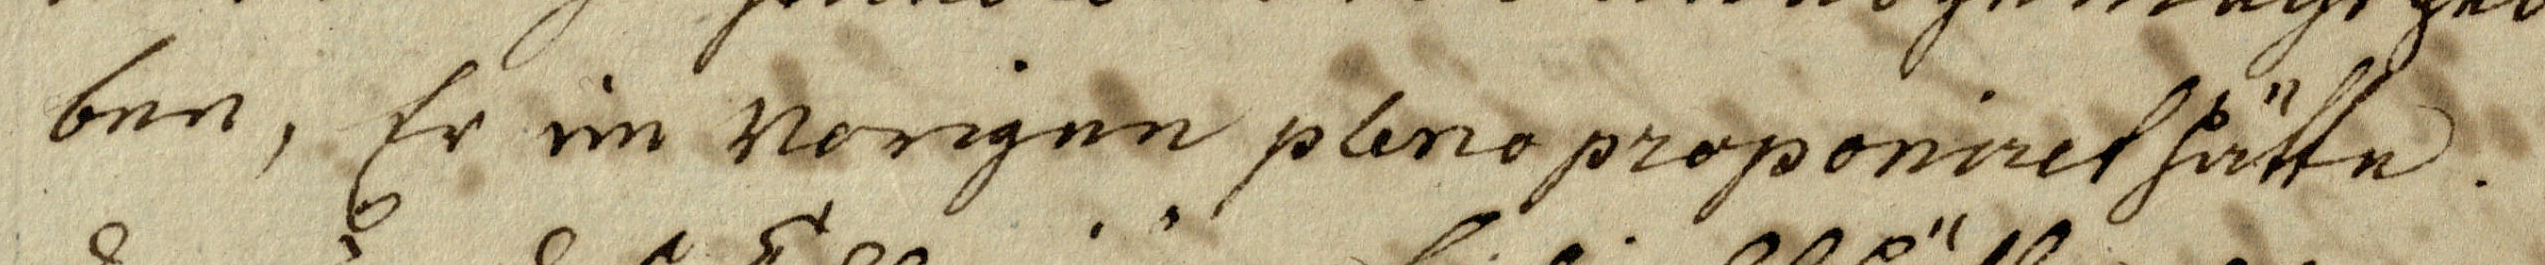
ben, Er im vorigen pleno proponiret hätte.
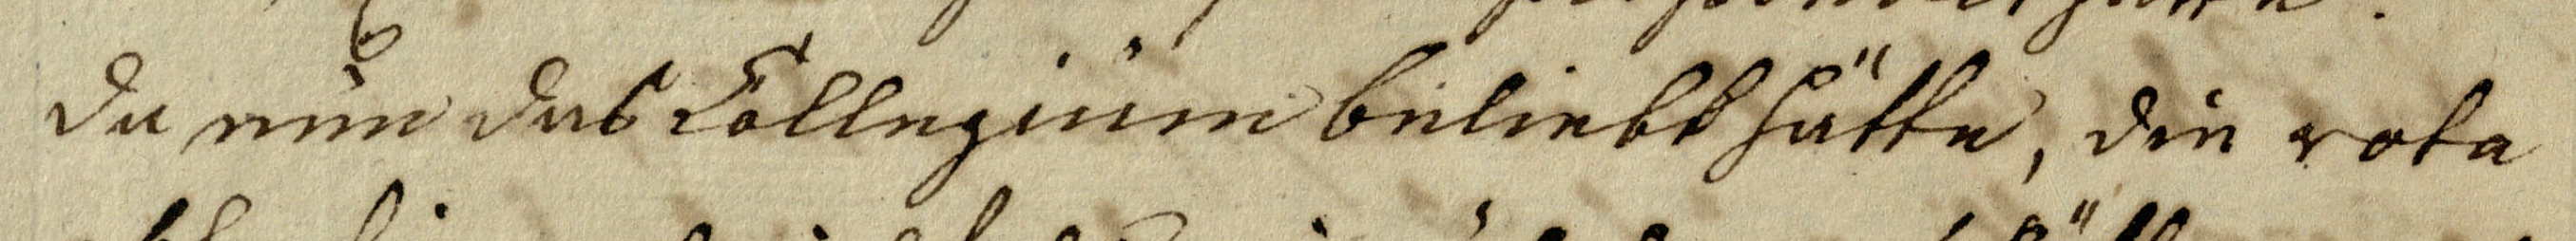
Da nun das Collegium beliebt hätte, die vota
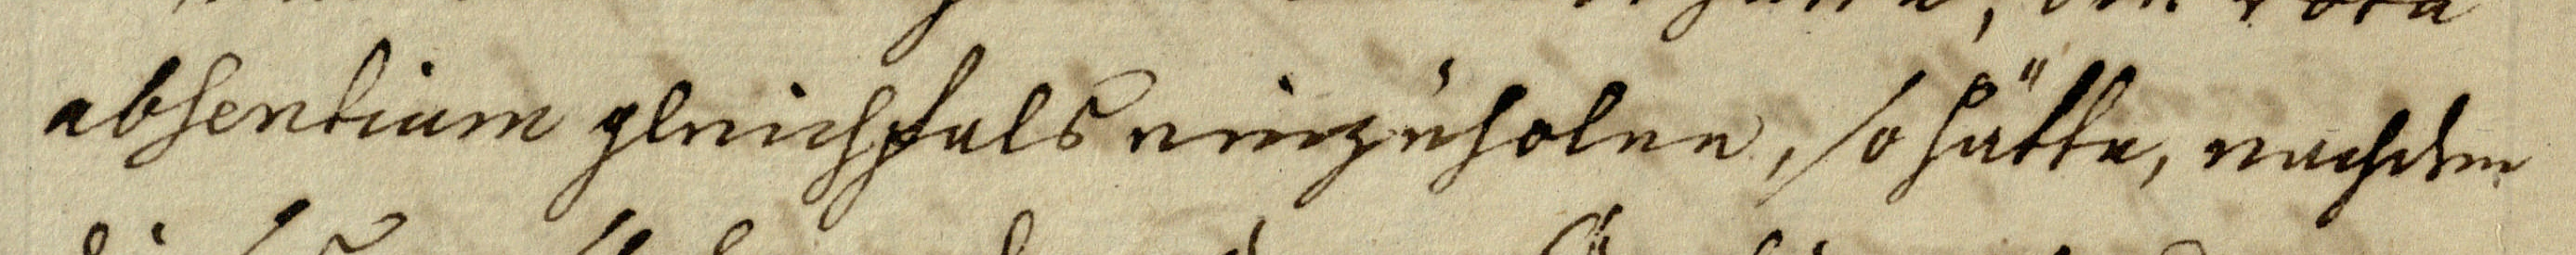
absentium gleichfals einzuholen, so hätte, nachdem
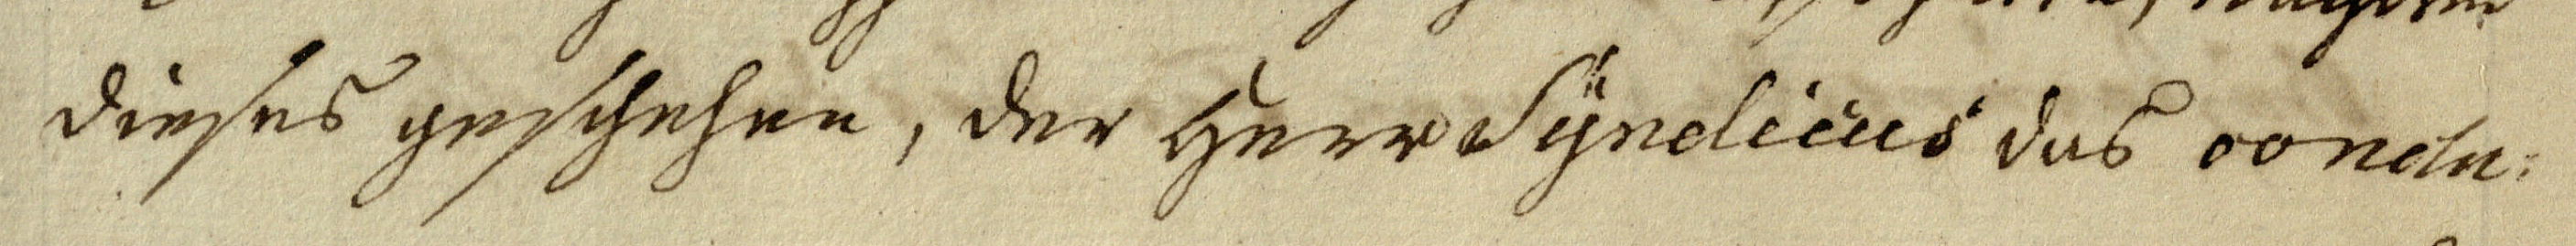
dieses geschehen, der Herr Sÿndicus das conclu¬
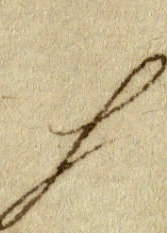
s
